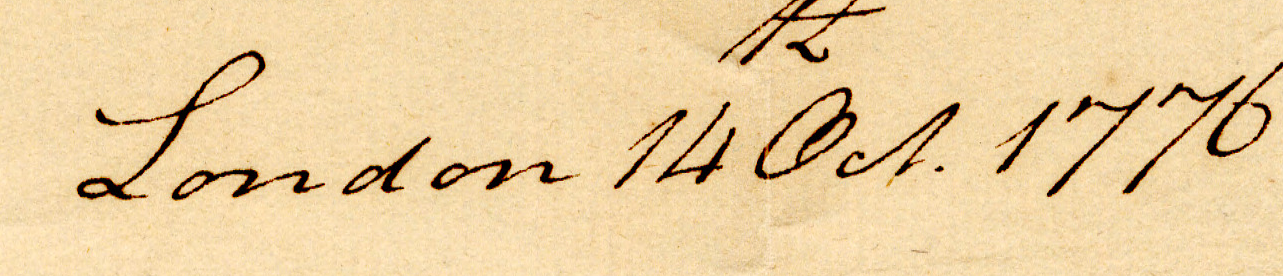London 14^th Oct. 1776
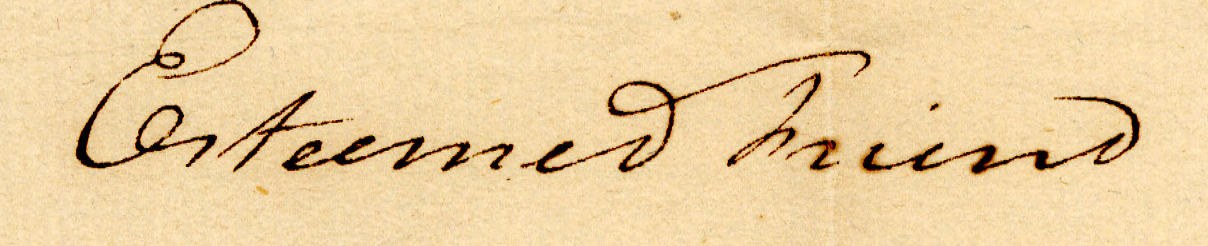Esteemed Friend
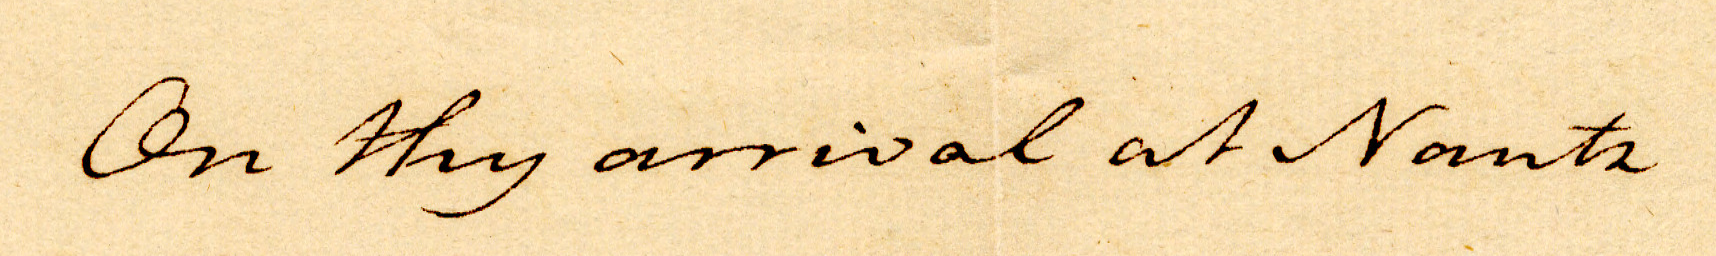On thy arrival at Nantz
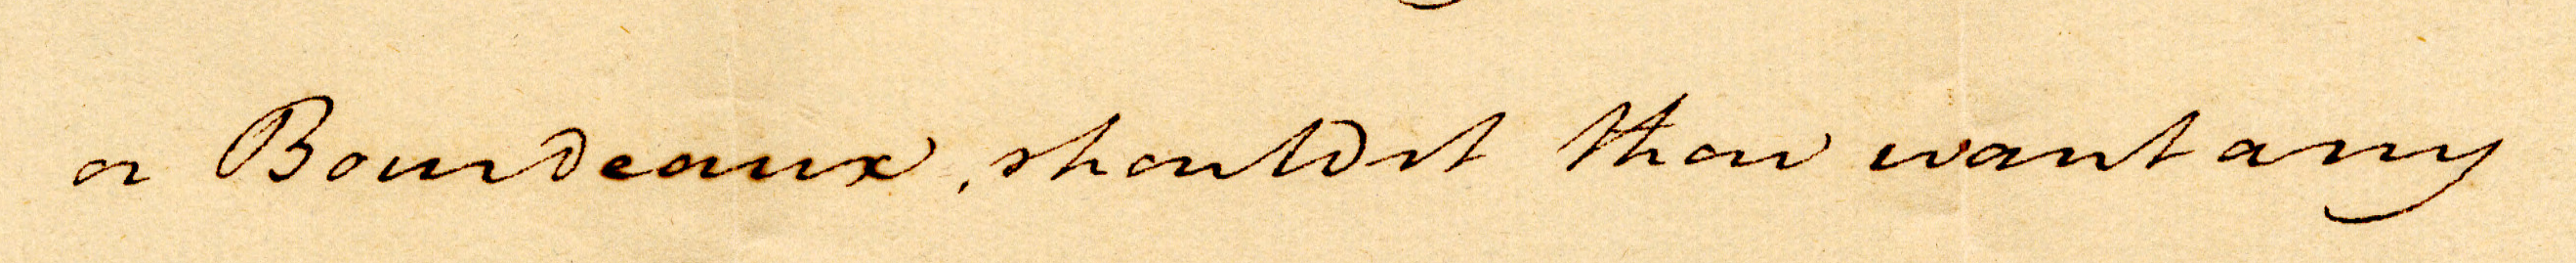or Bourdeaux shouldst thou want any
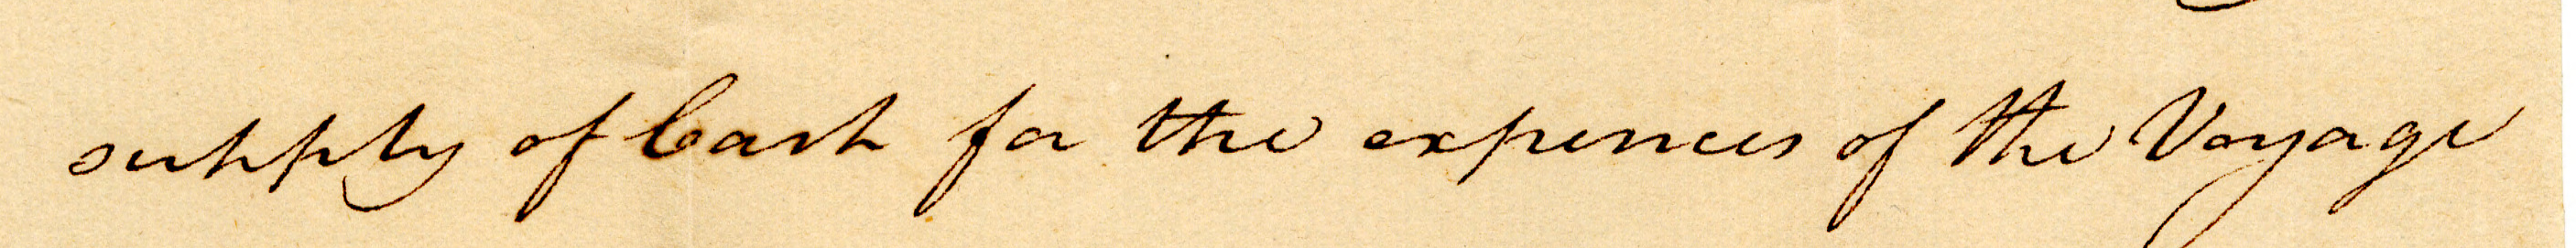supply of Cash for the expences of the Voyage
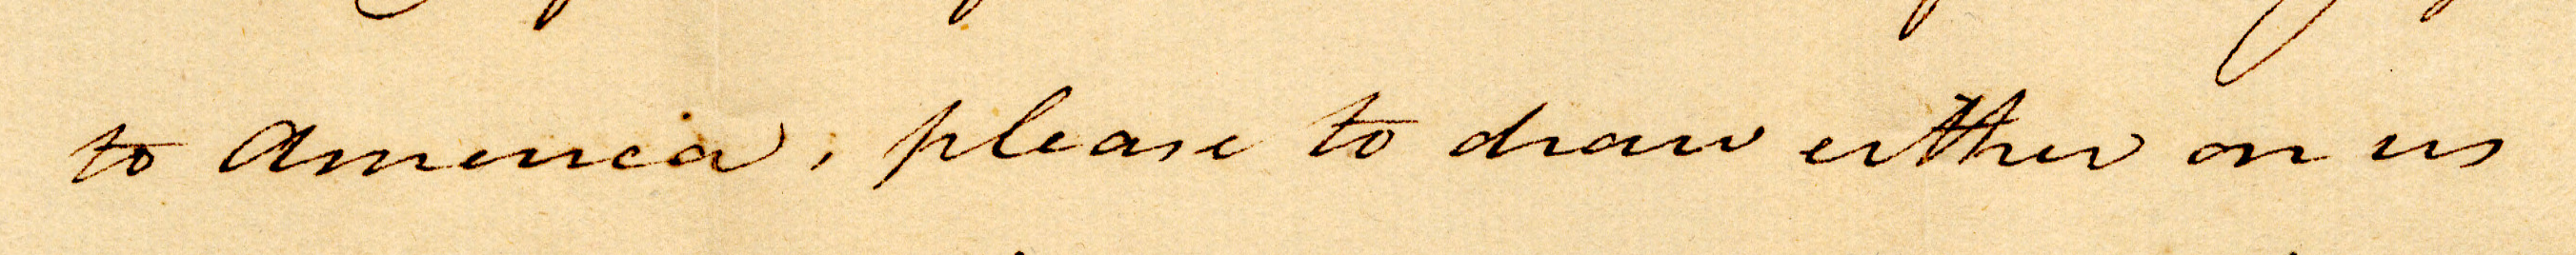to America; please to draw either on us
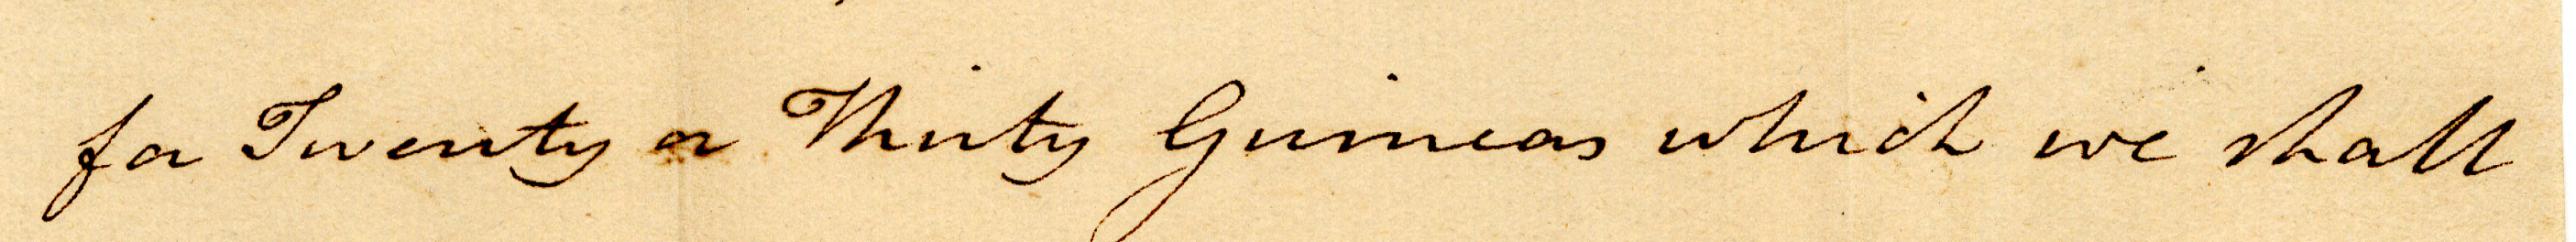for Twenty or Thirty Guineas which we shall
